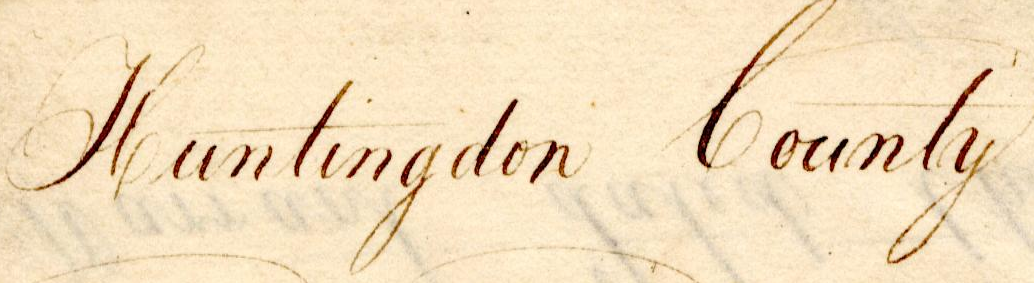Huntingdon County
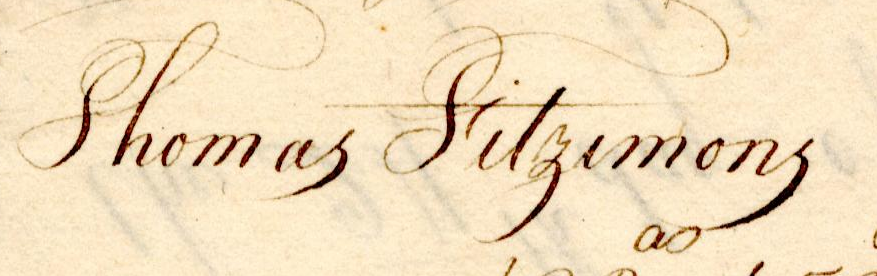Thomas Fitzimons
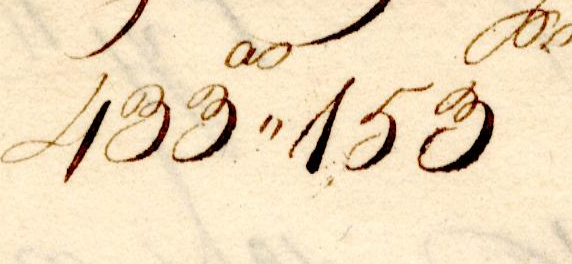433^as. 453 ^pr
